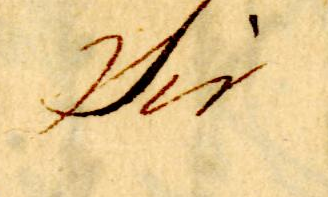Sir
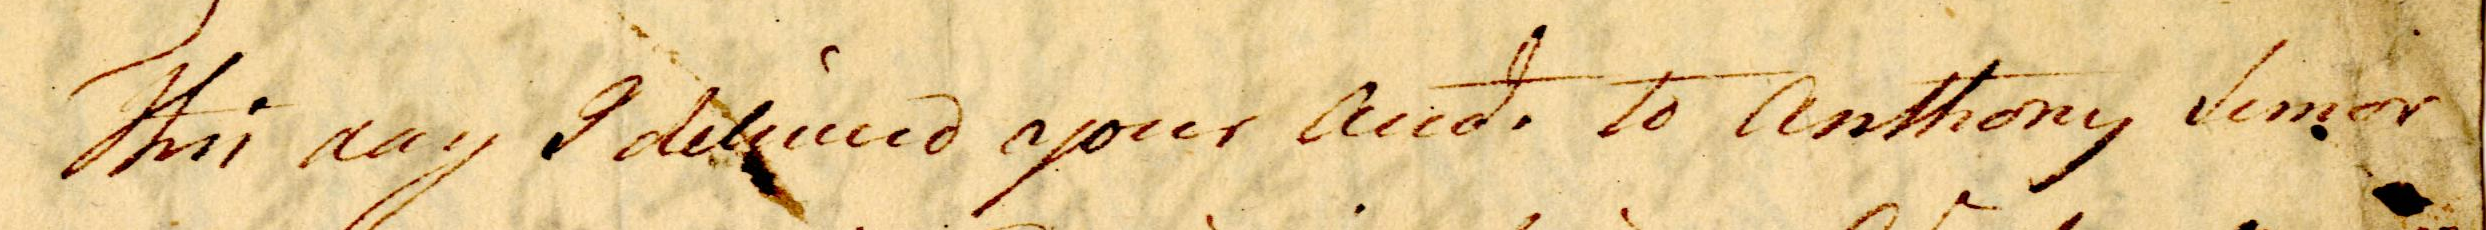this day I delievered your acco^t. to Anthony Simon
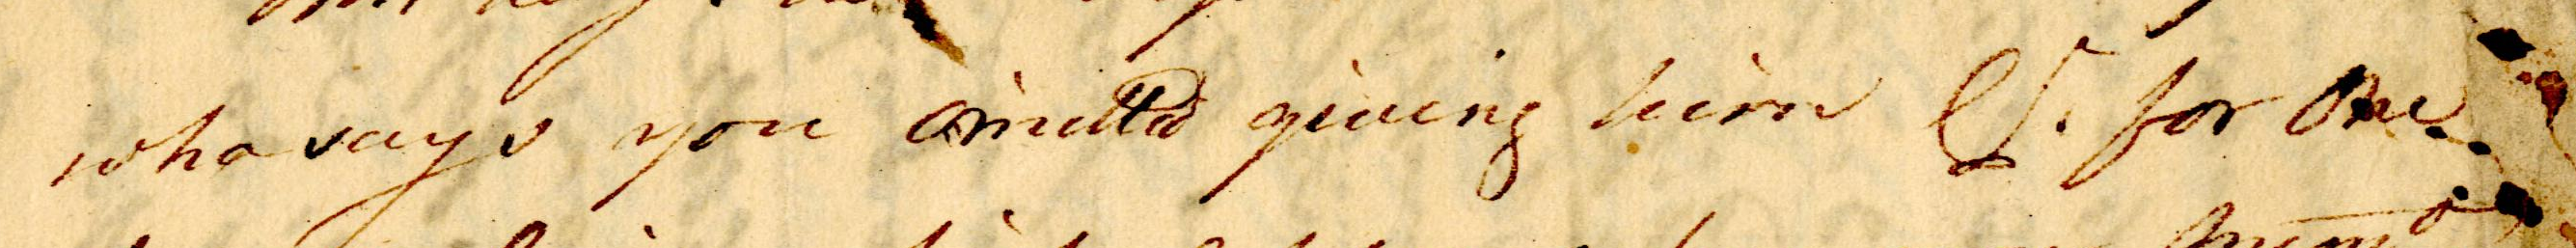who says you omitt'd giving him I for one
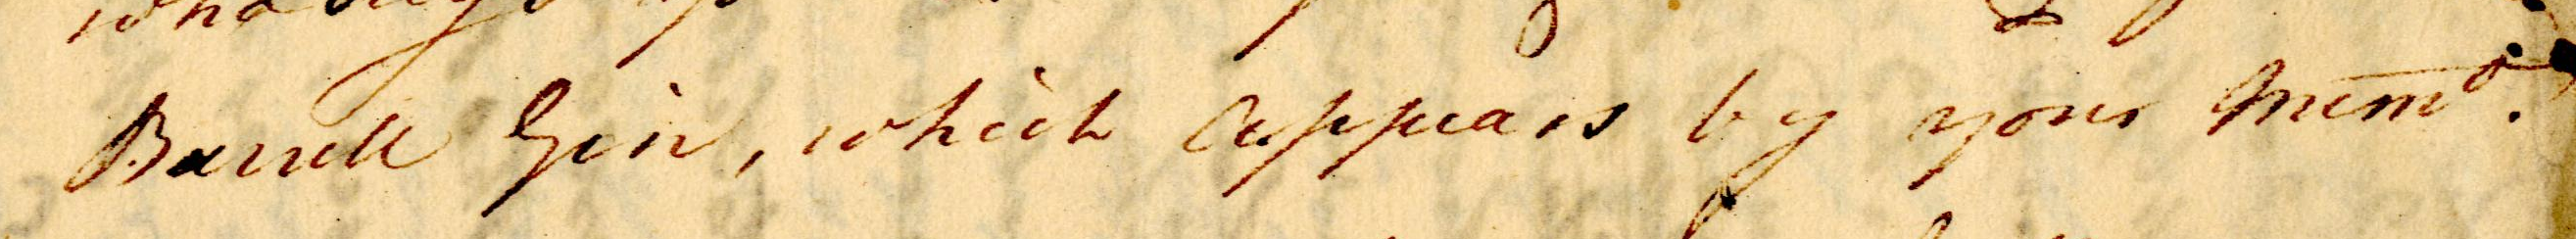Barrel Gin, which appears by your Ment^g
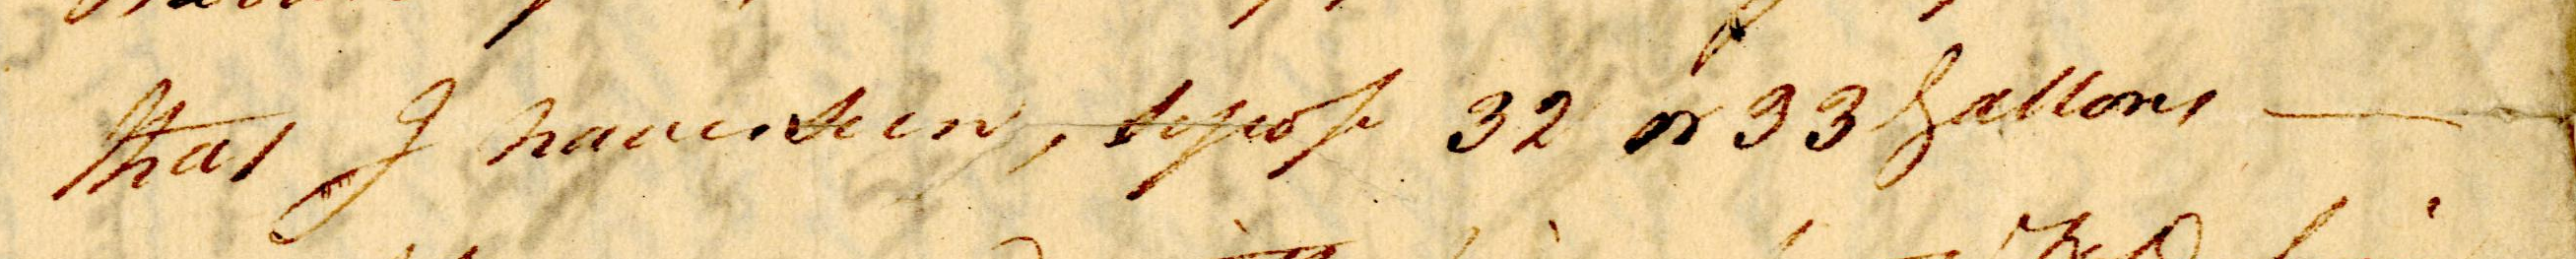that I have seen, dispose 32 or 33 Gallons-
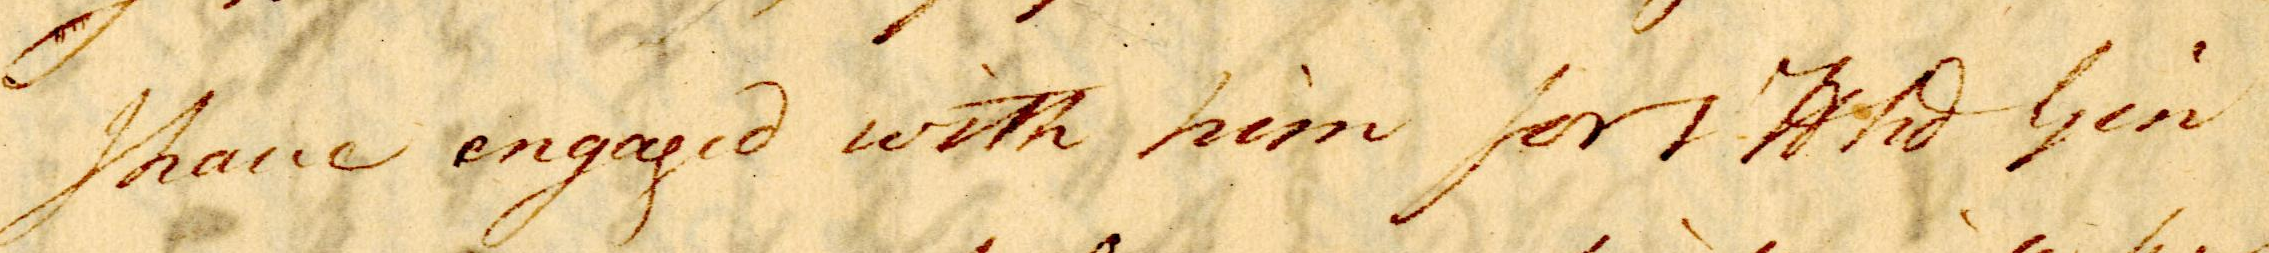I have engaged with him for 1 Hhd Gin
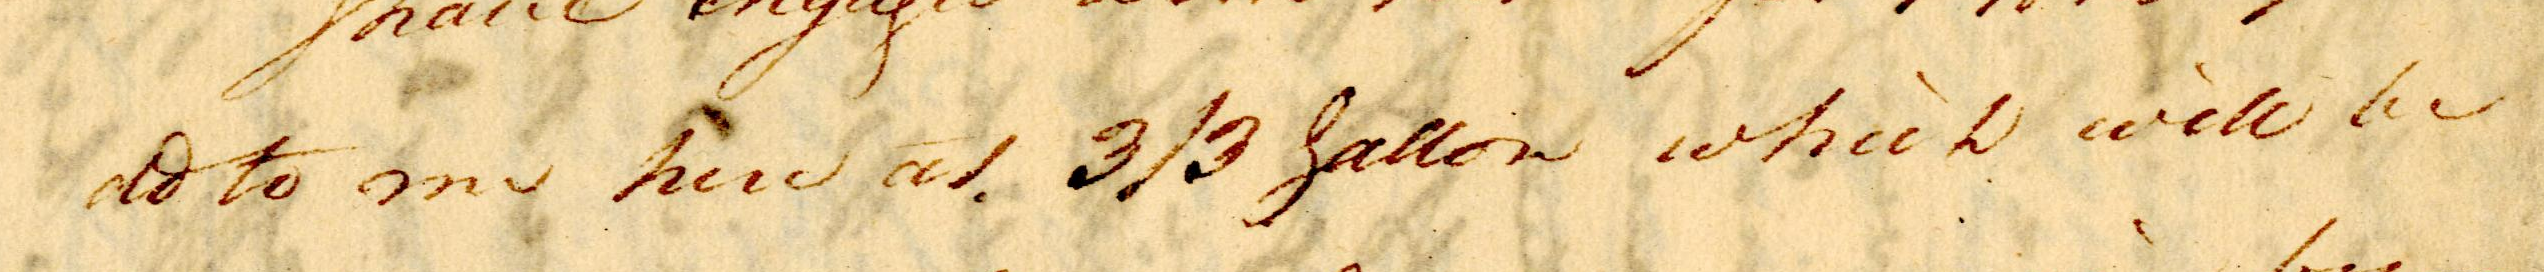dd to me here at 3s3 gallon which will be
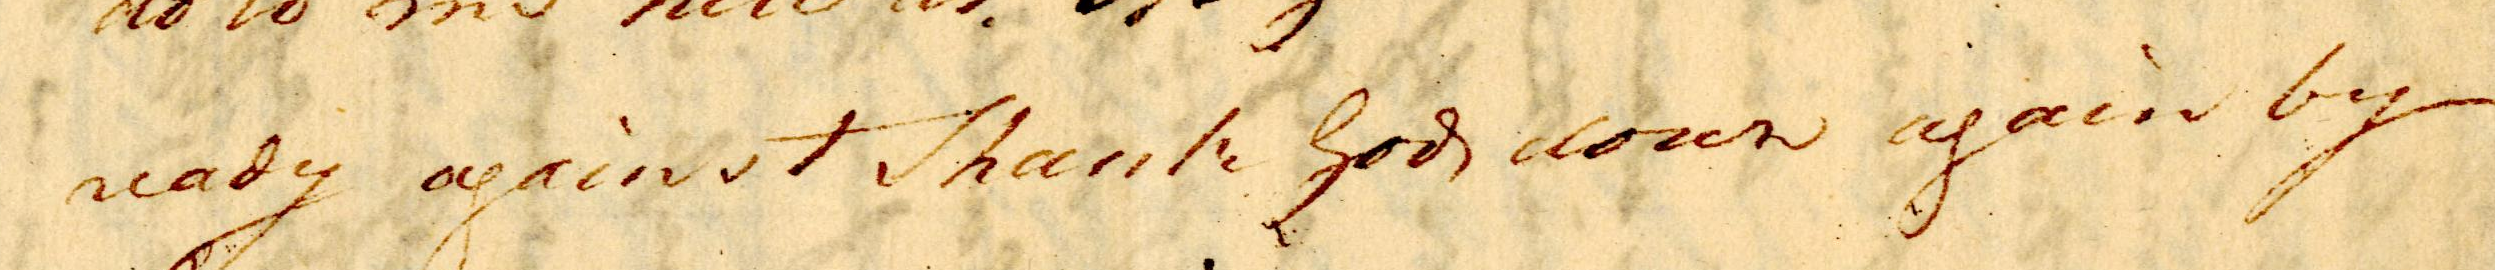ready against Thank God down again by
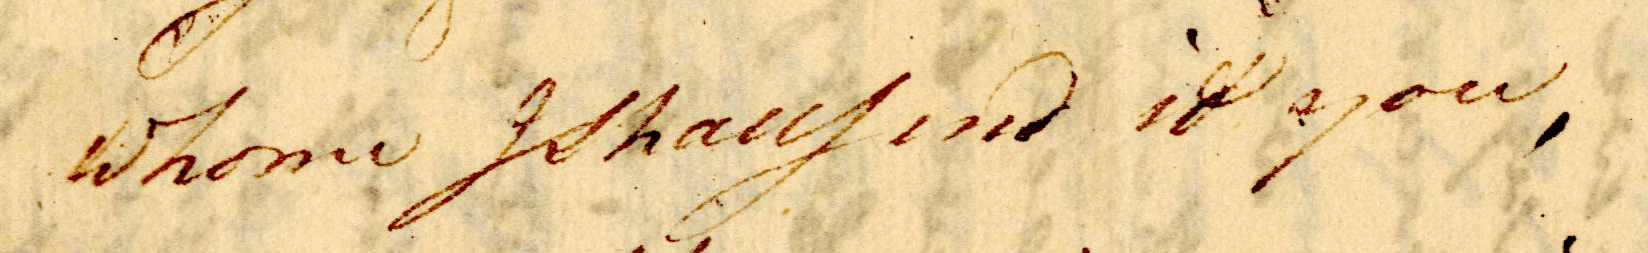whome I shall find if you,
